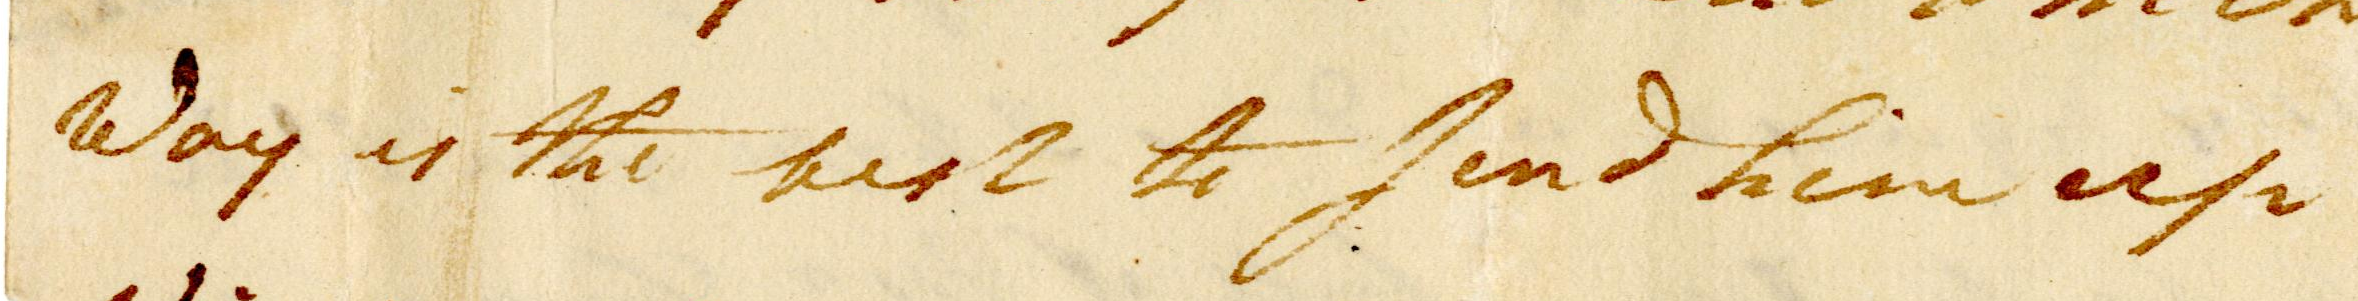Way is the best to Send him up
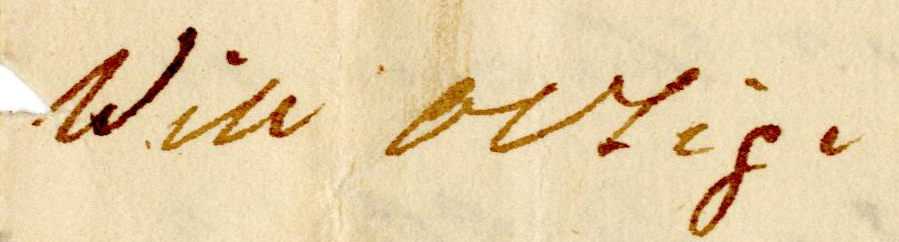Will Oblige
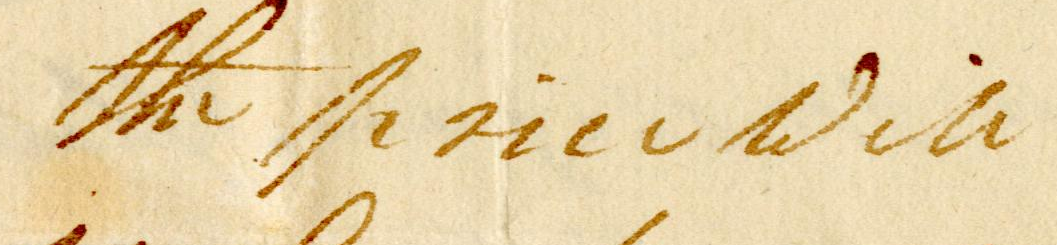The price will
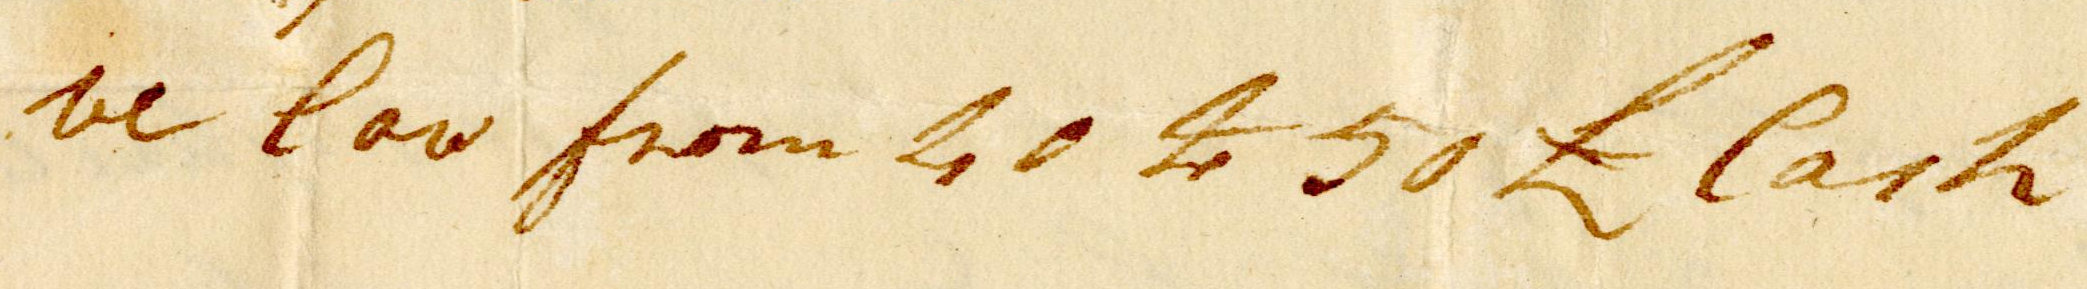be low from 40 to 50 £ Cash
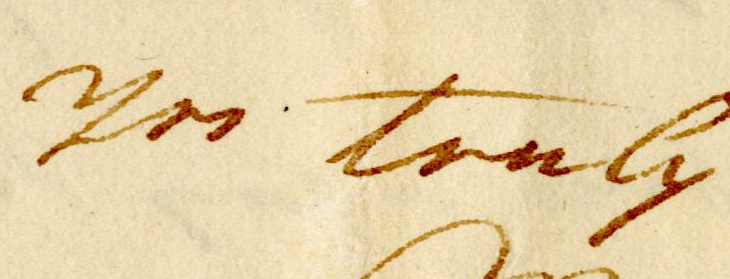Y^rs Truly
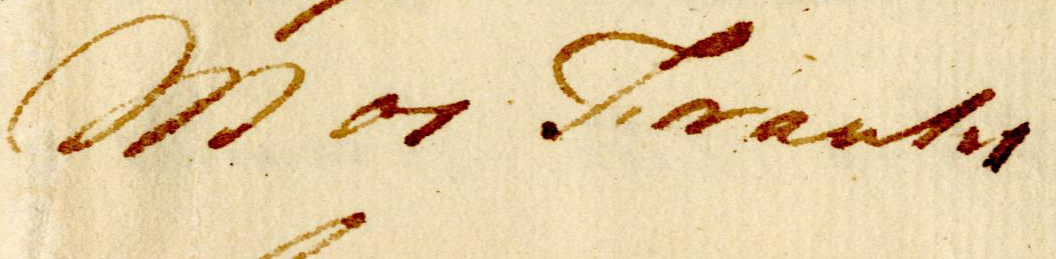Mos Franks
